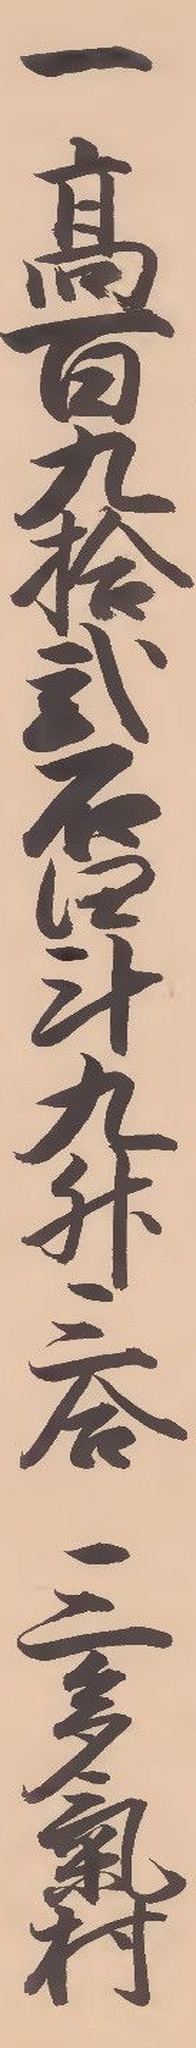一高百九拾弐石四斗九升三合三多気村
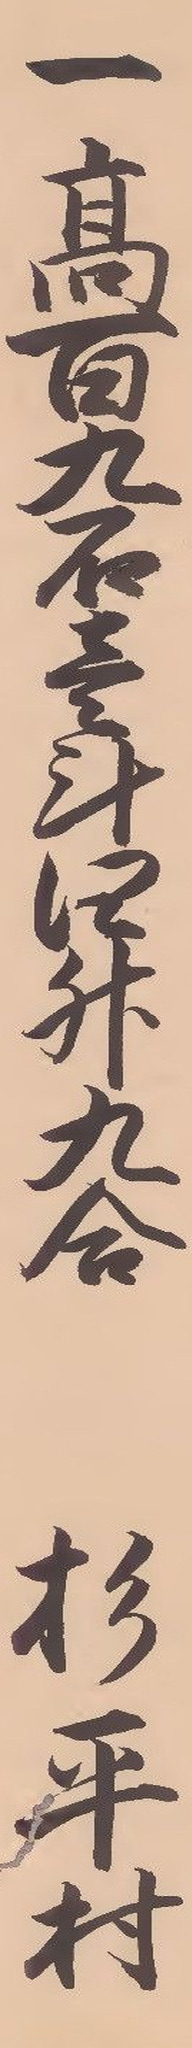一高百九石壱斗四升九合杉平村
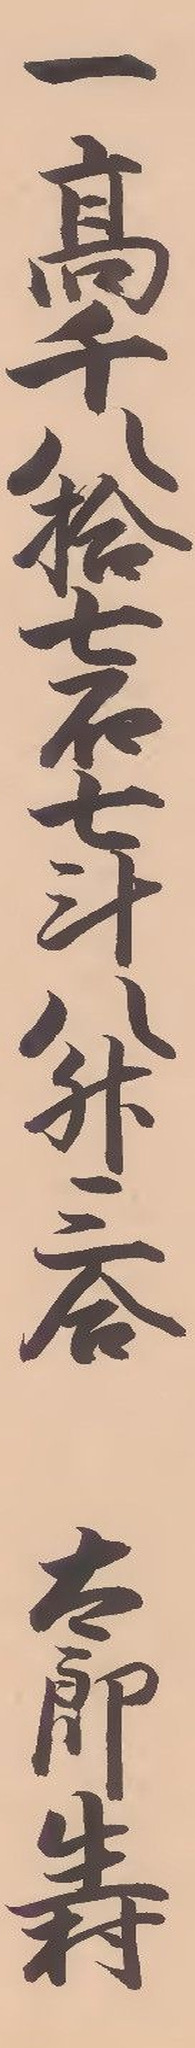一高千八拾七石七斗八升三合太郎生村

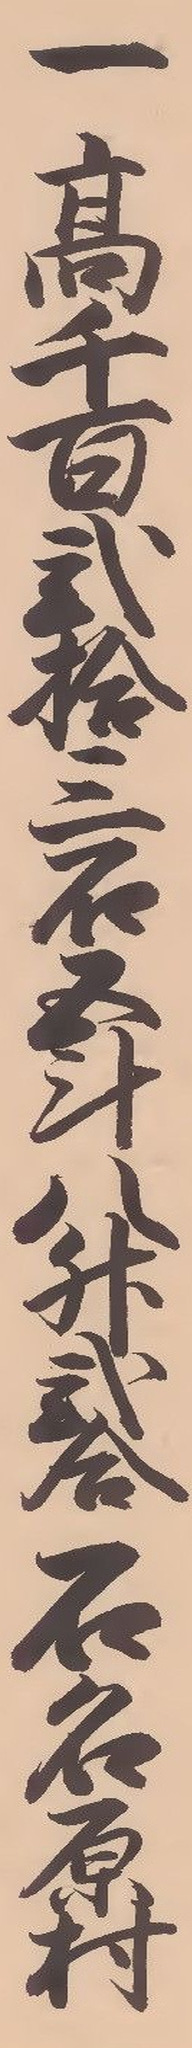一高千百弐拾三石五斗八升弐合石名原村
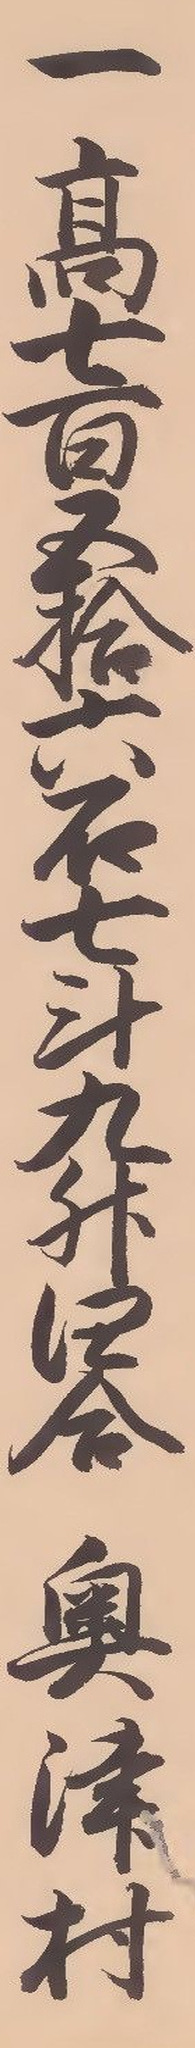一高七百五拾六石七斗九升四合奥津村
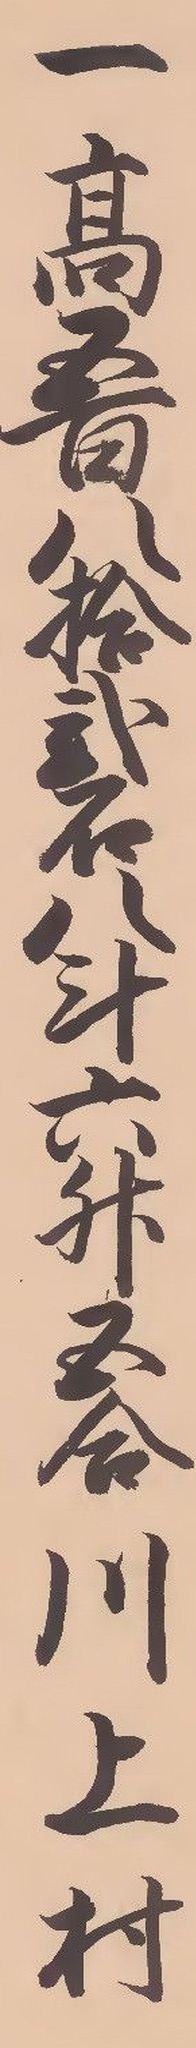一高五百八拾弐石八斗六升五合川上村
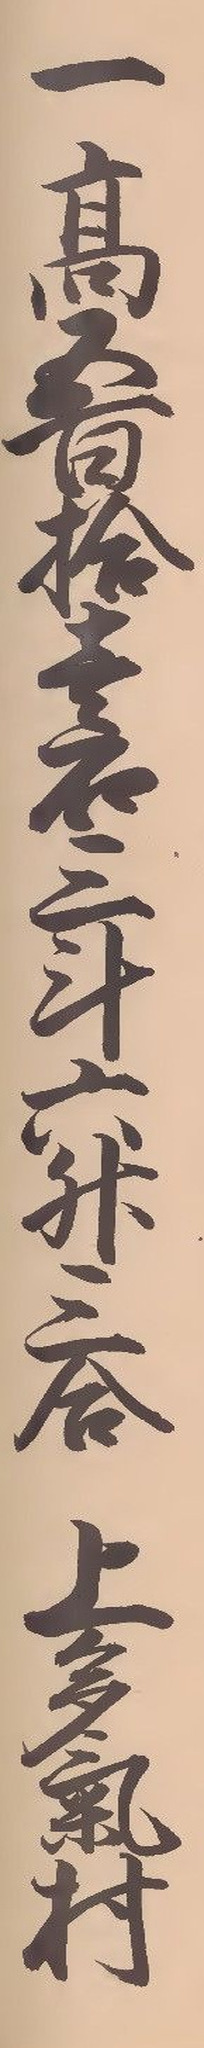一高五百拾壱石三斗六升三合上多気村
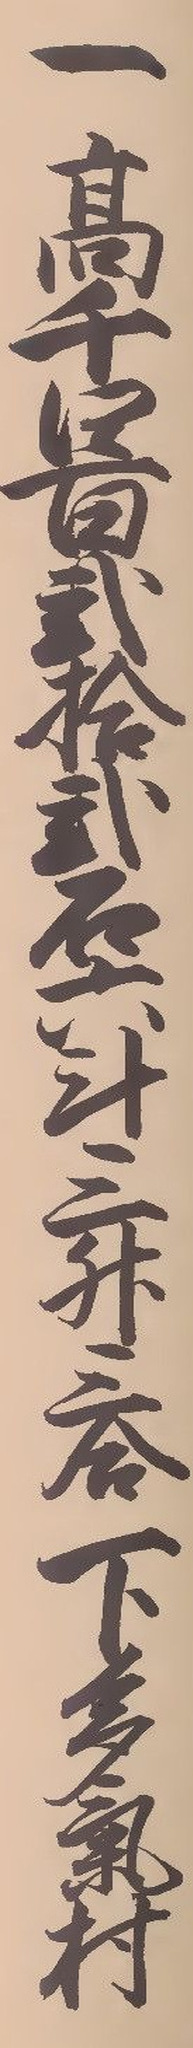一高千四百弐拾弐石六斗三升三合下多気村
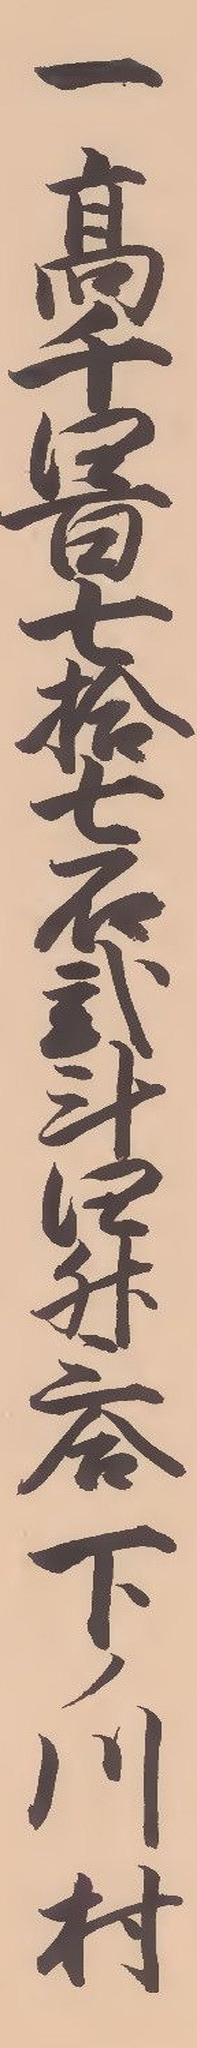一高千四百七拾七石弐斗四升三合下ノ川村
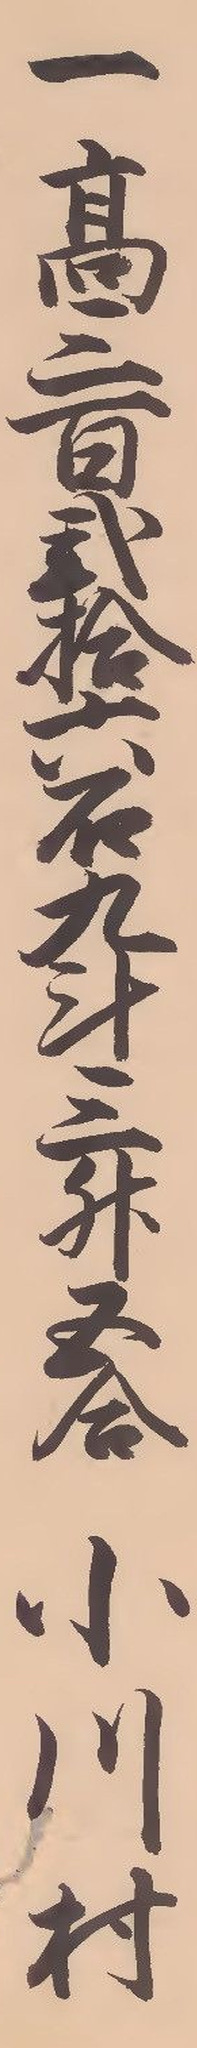一高三百弐拾六石九斗三升五合小川村
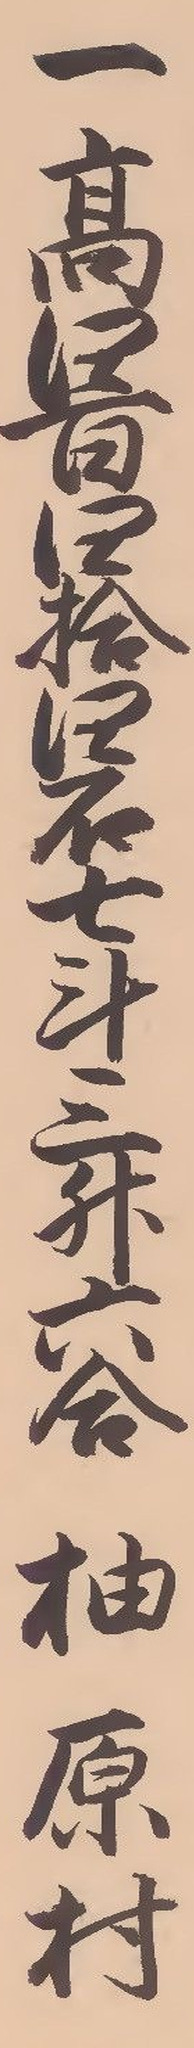一高四百四拾四石七斗三升六合柚原村

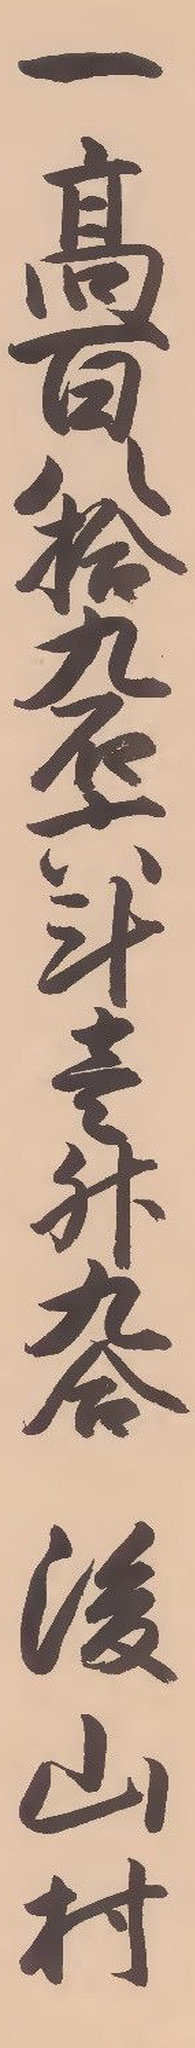一高百八拾九石六斗壱升九合後山村
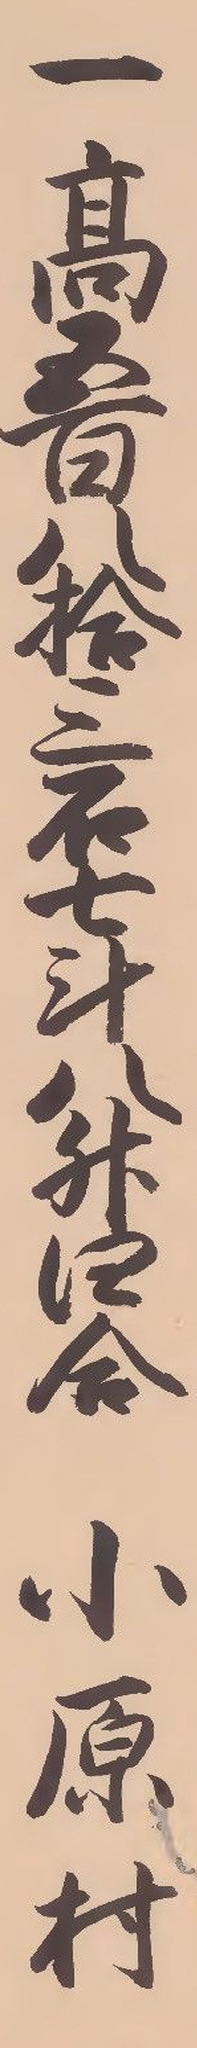一高五百八拾三石七斗八升四合小原村
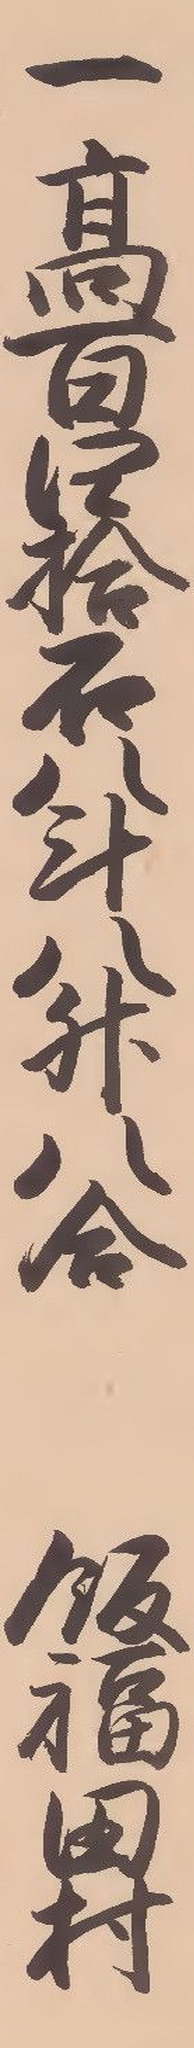一高百四拾石八斗八升八合飯福田村
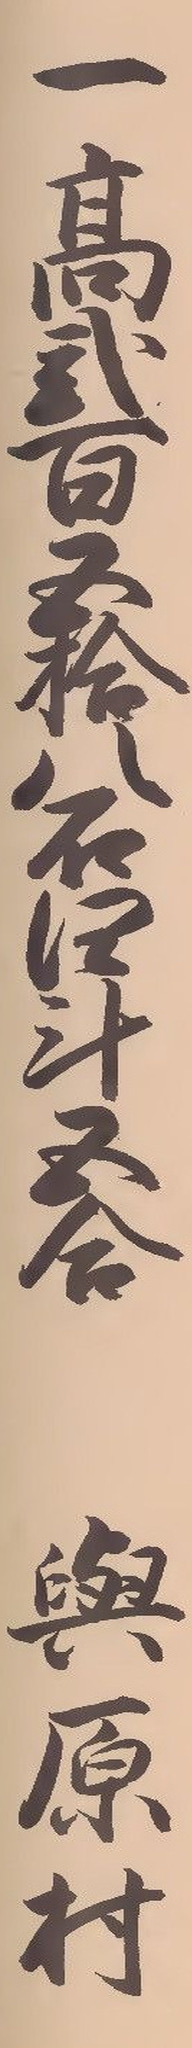一高弐百五拾八石四斗五合与原村
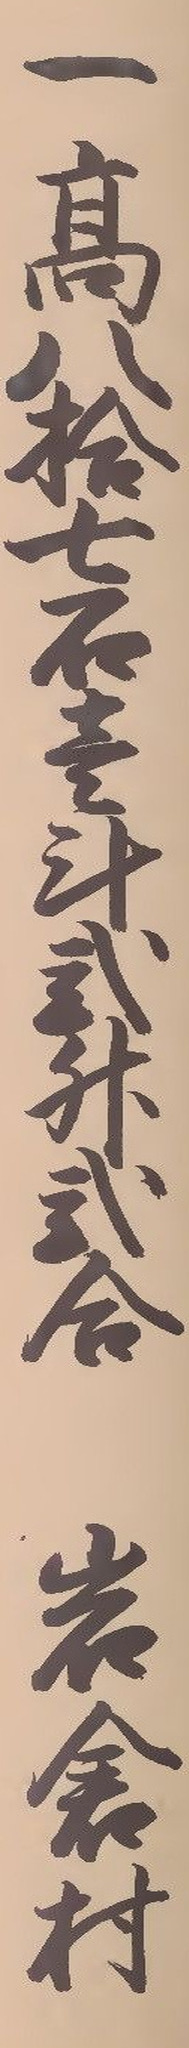一高八拾七石壱斗弐升弐合岩倉村
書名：伊勢国郷帳
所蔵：国立公文書館 National Archives of Japan
